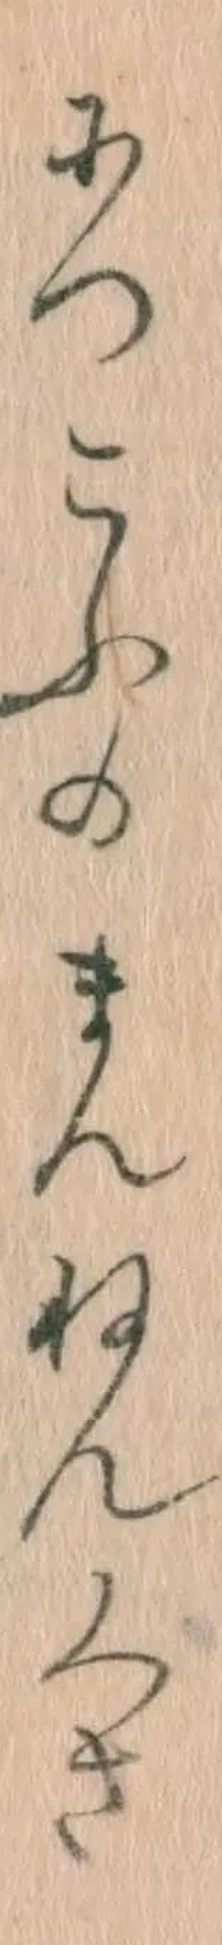につこふのまんねんくさ
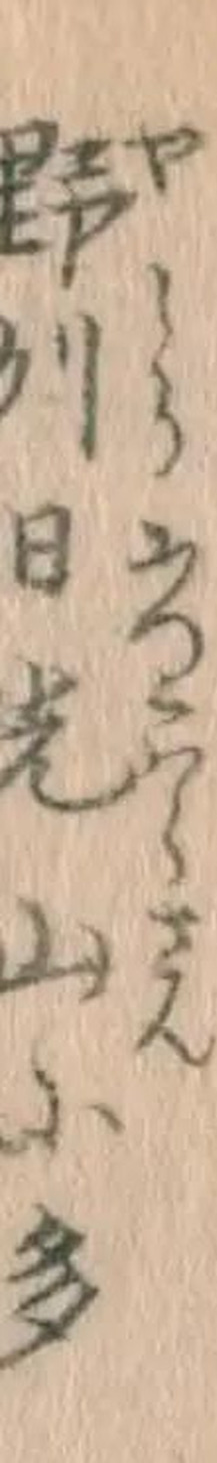野州日光山に多
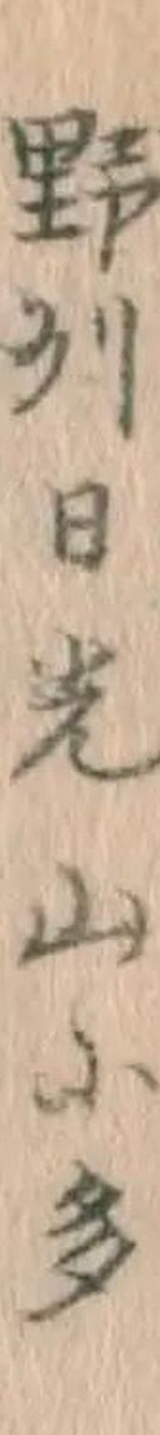野州日光山に多
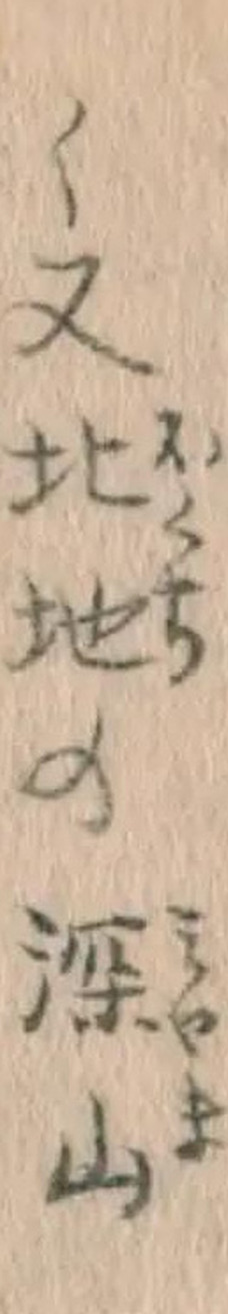く又北地の深山
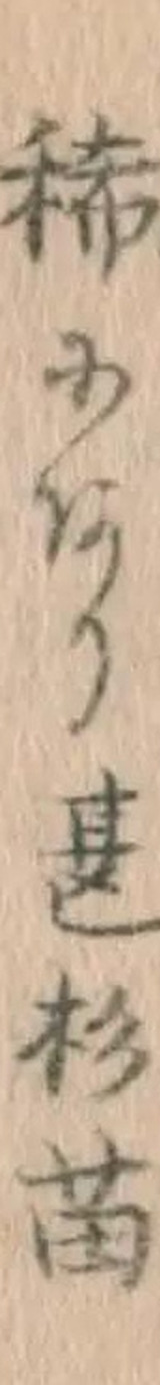稀にあり甚杉苗
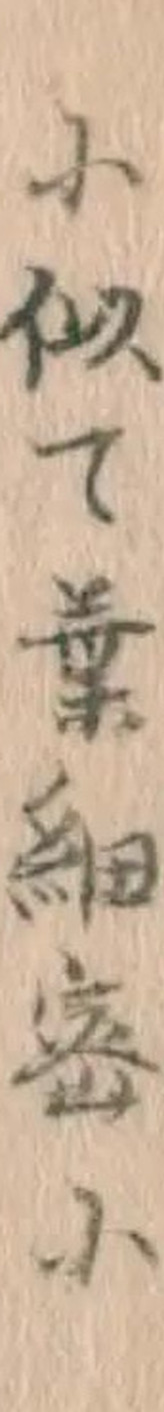に似て葉細密に
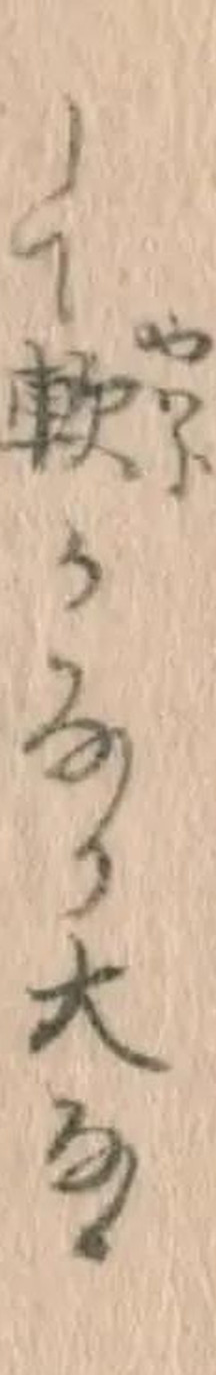して軟かなり大なる
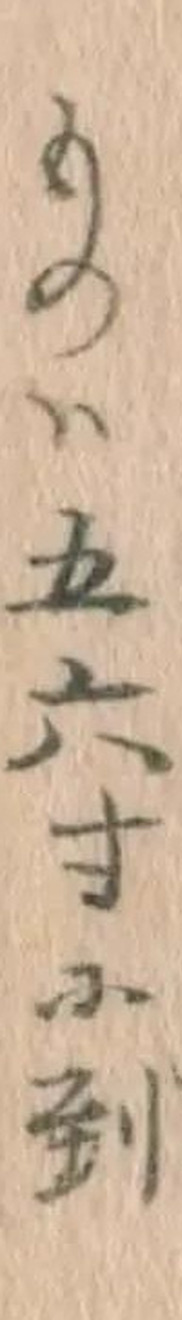ものは五六寸に到
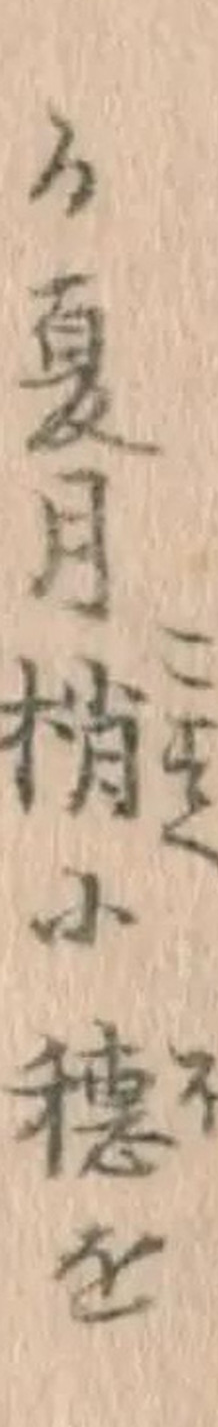る夏月梢に穂を
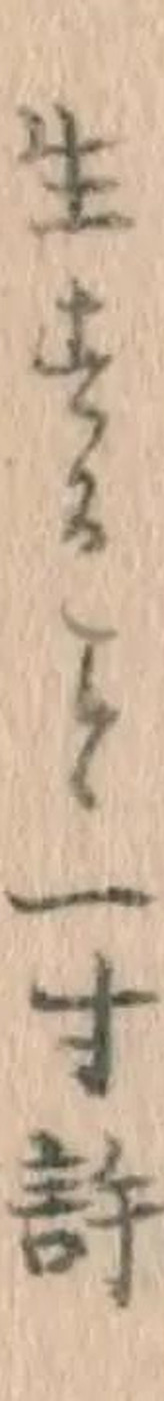生すること一寸許
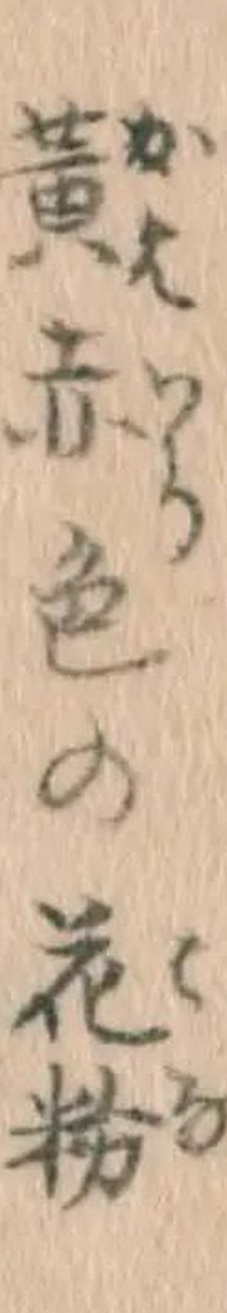黄赤色の花粉
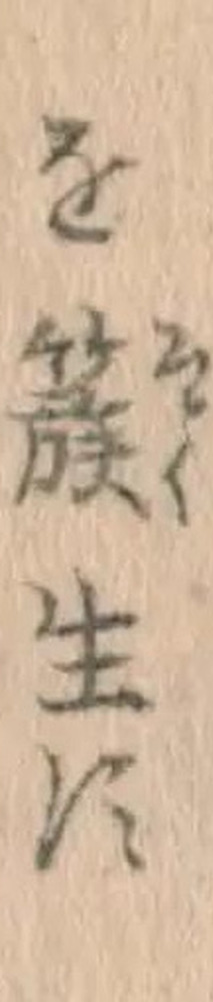を簇生す

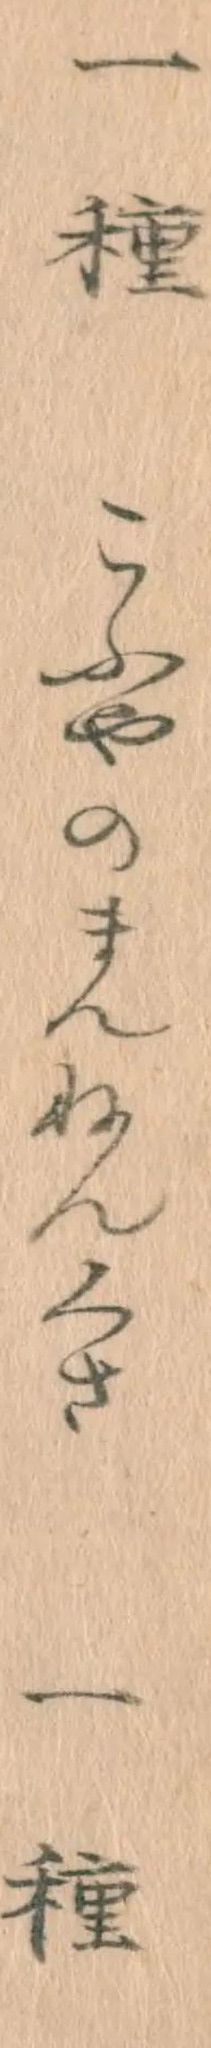一種こふやのまんねんくさ
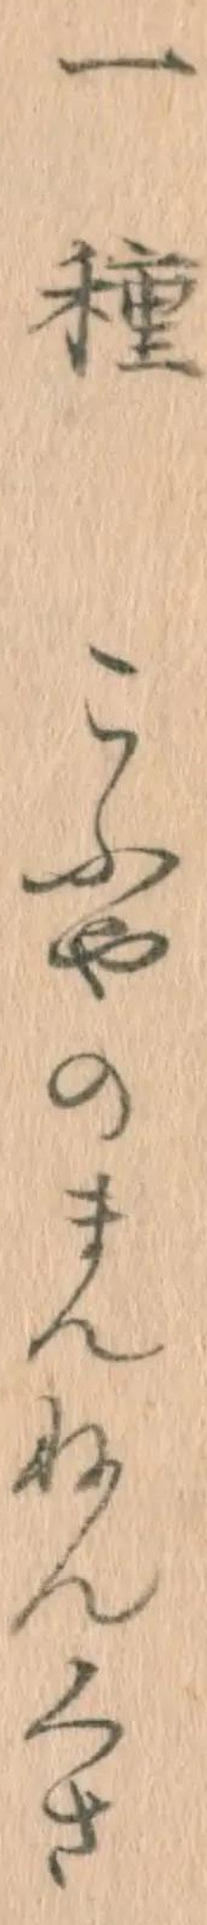一種こふやのまんねんくさ
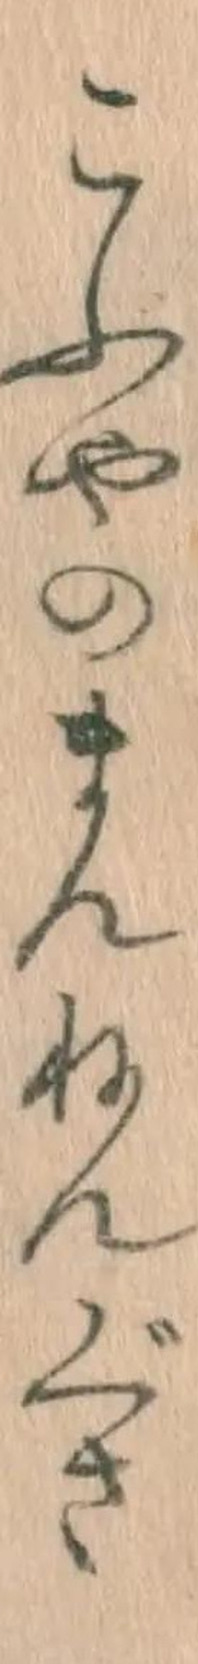こふやのまんねんぐさ
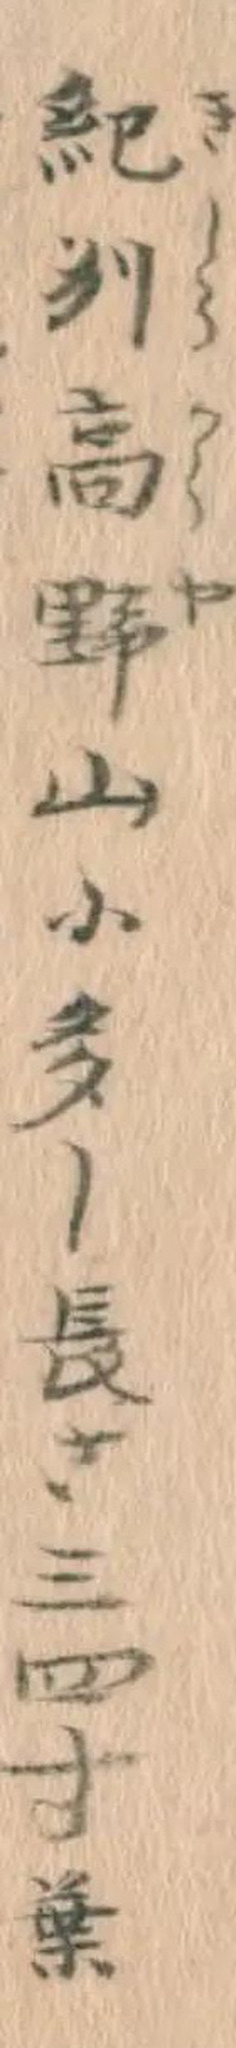紀州高野山に多し長さ三四寸葉
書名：本草図譜. 巻37-39
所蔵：国立国会図書館 National Diet Library, JAPAN
